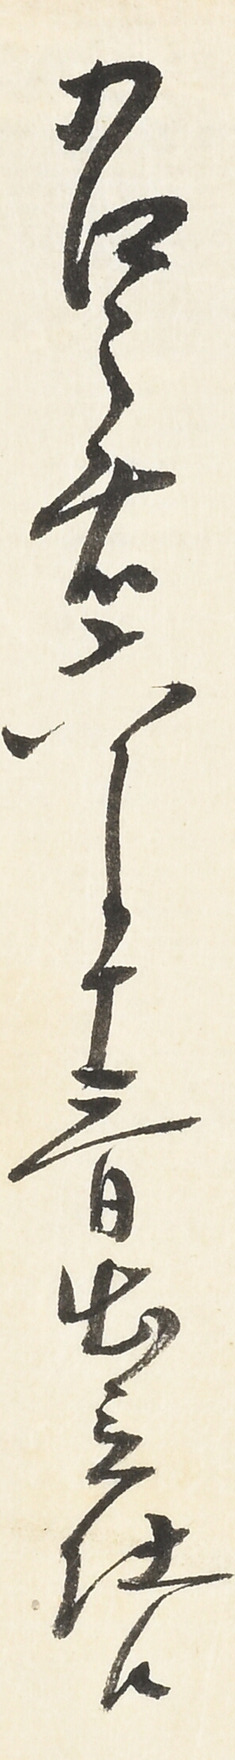右之者六月十三日出立仕候
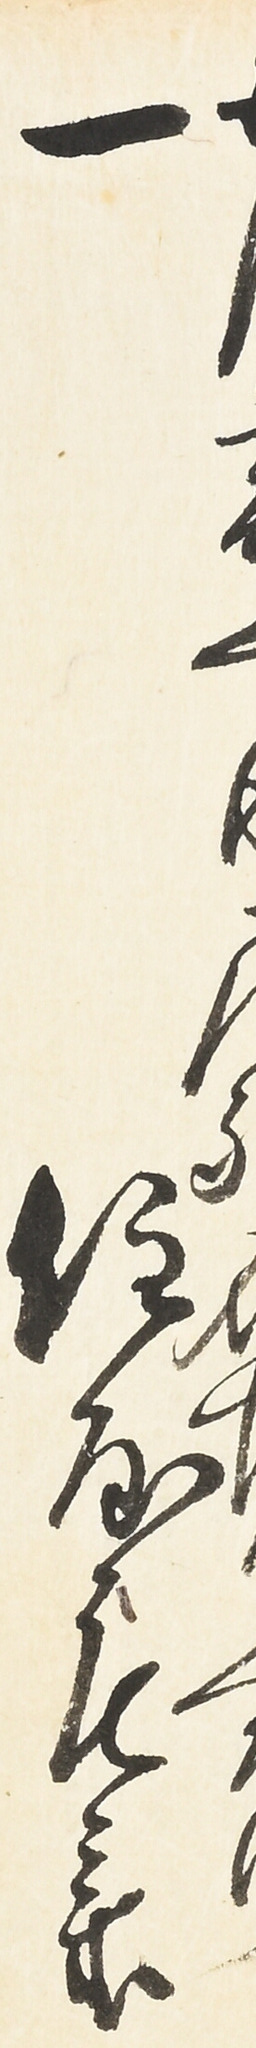一住屋庄兵衛
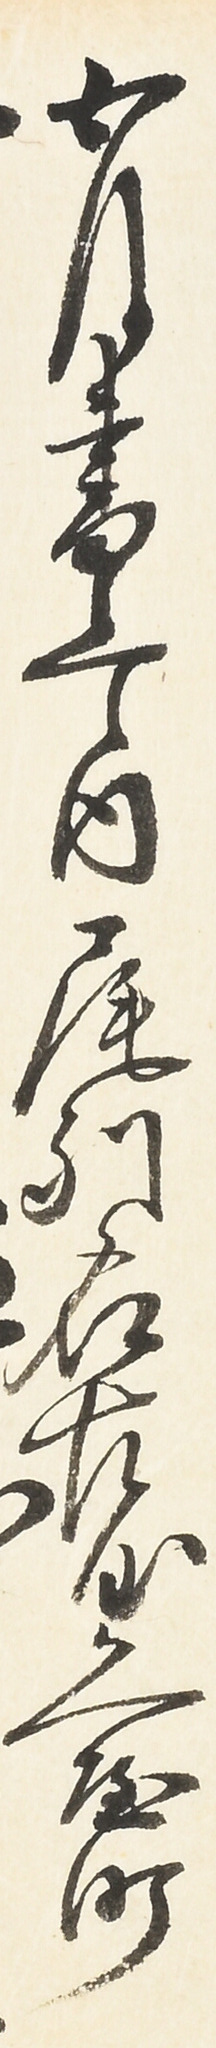五月書上之内尾州名古屋久屋町
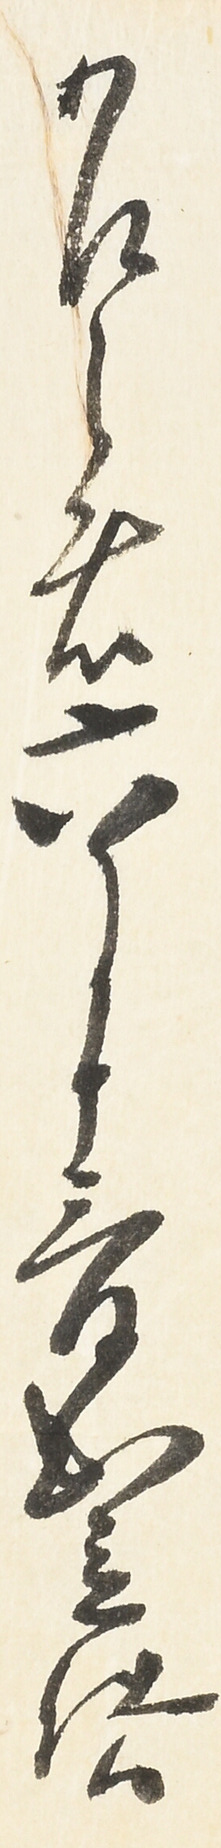右之者六月十三日出立仕候
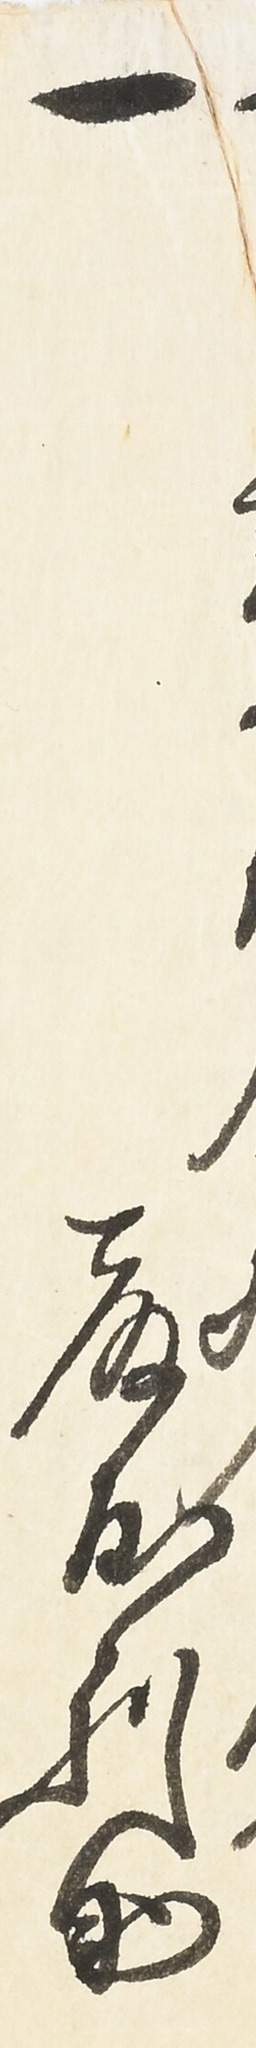一藤屋利助
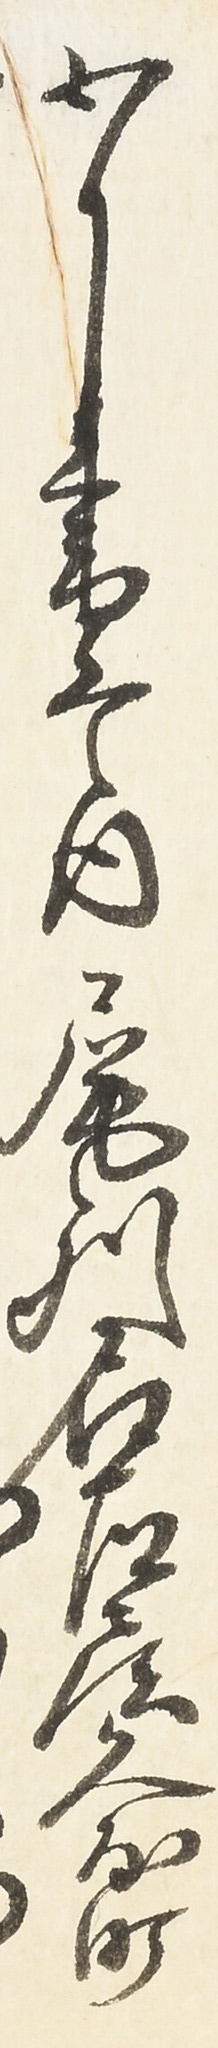五月書上之内尾州名古屋久屋町
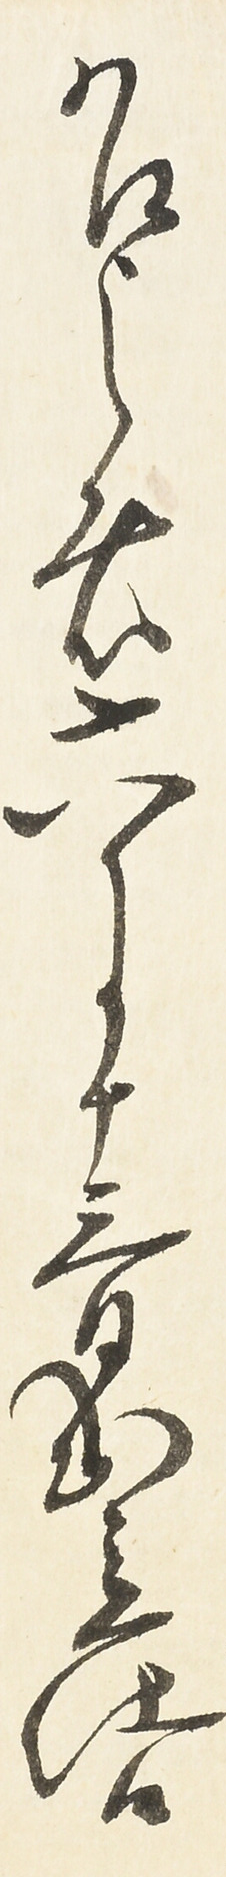右之者六月十三日出立仕候
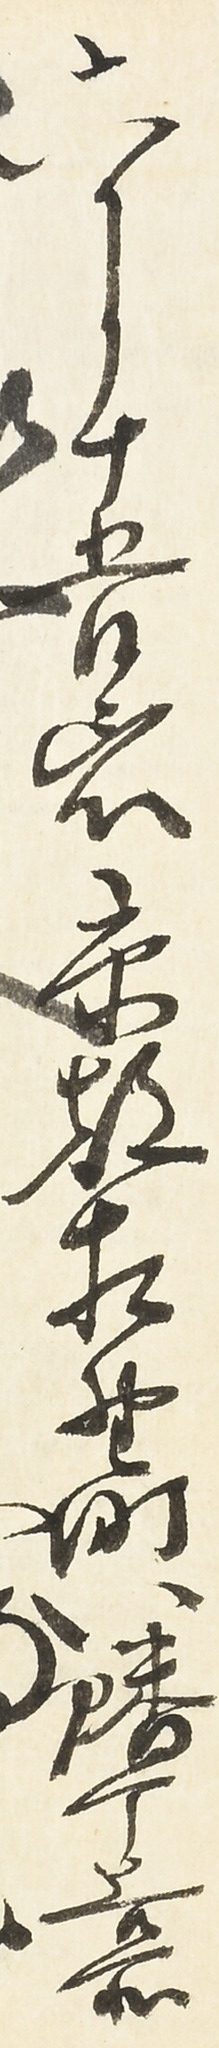六月十五日着京都相野町八幡丁上ル所
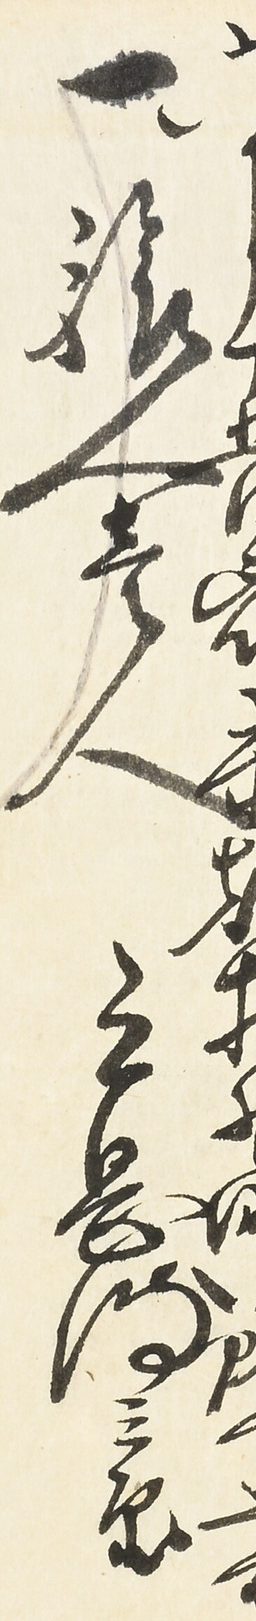一旅人壱人兵岡伝兵衛
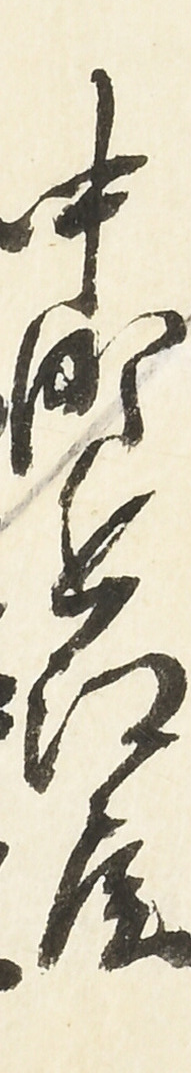中町近江屋
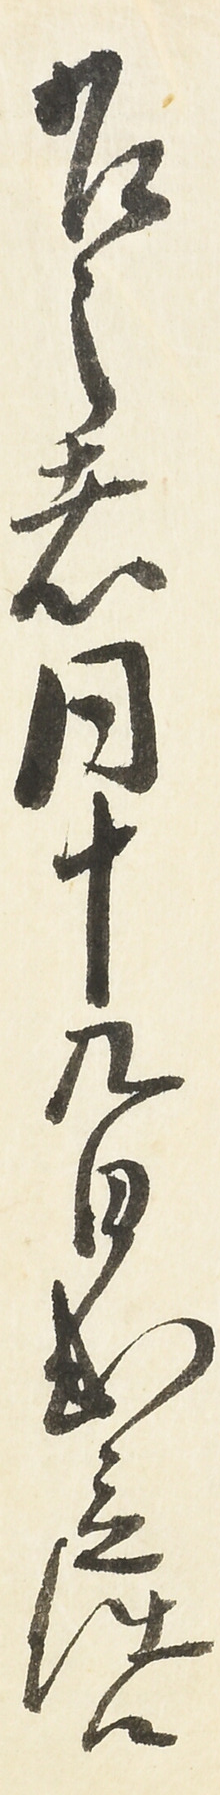右之者同十九日出立仕候
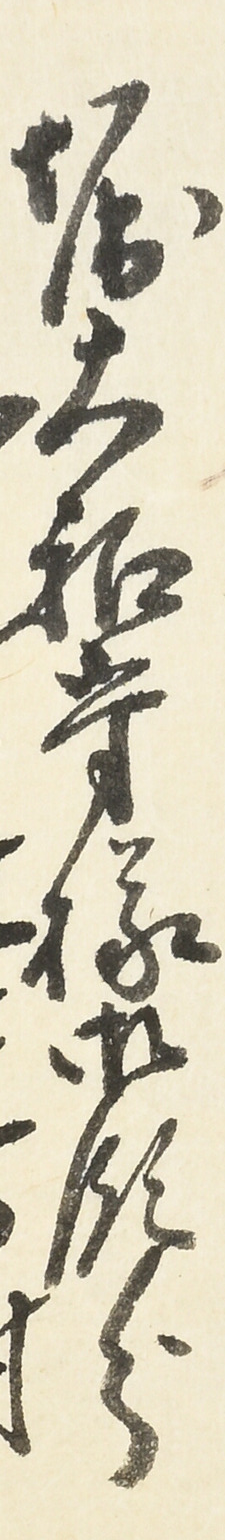堀大和守様御領分
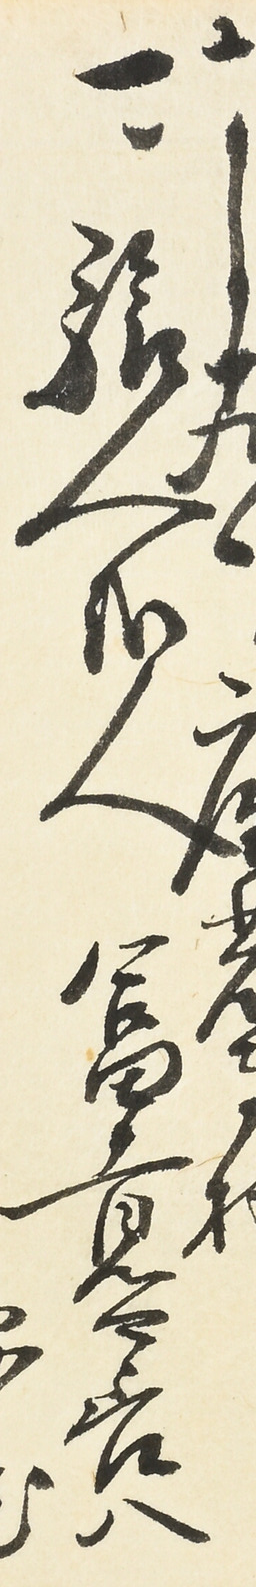一旅人弐人冨士見善八
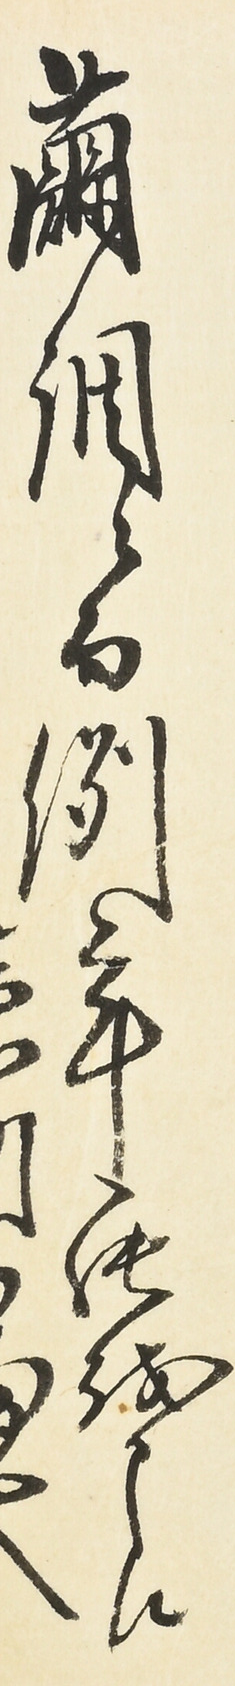繭調ニ而例年罷越申候
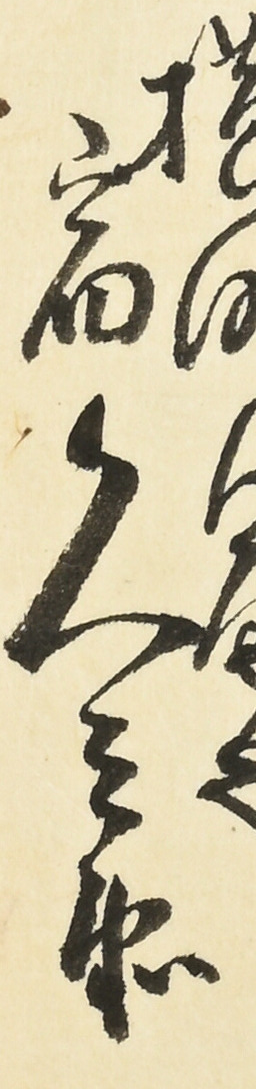宿久兵衛
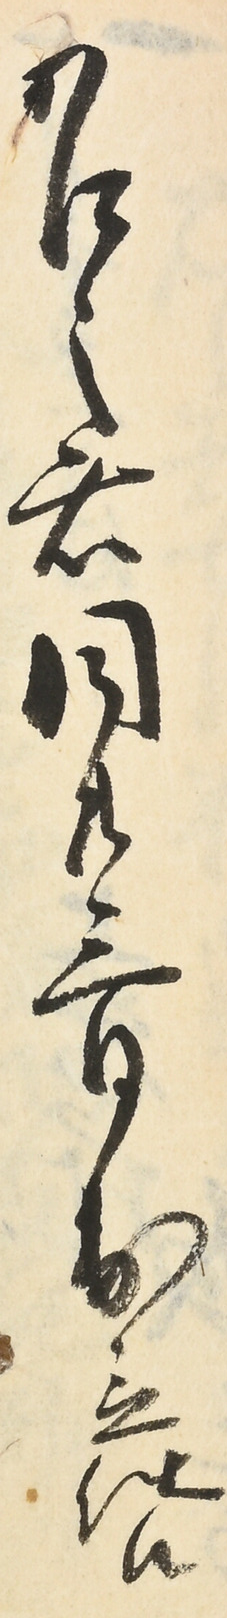右之者六月三日出立仕候
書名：町中旅人泊控帳
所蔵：伊那市立高遠町図書館・合同会社AMANE
